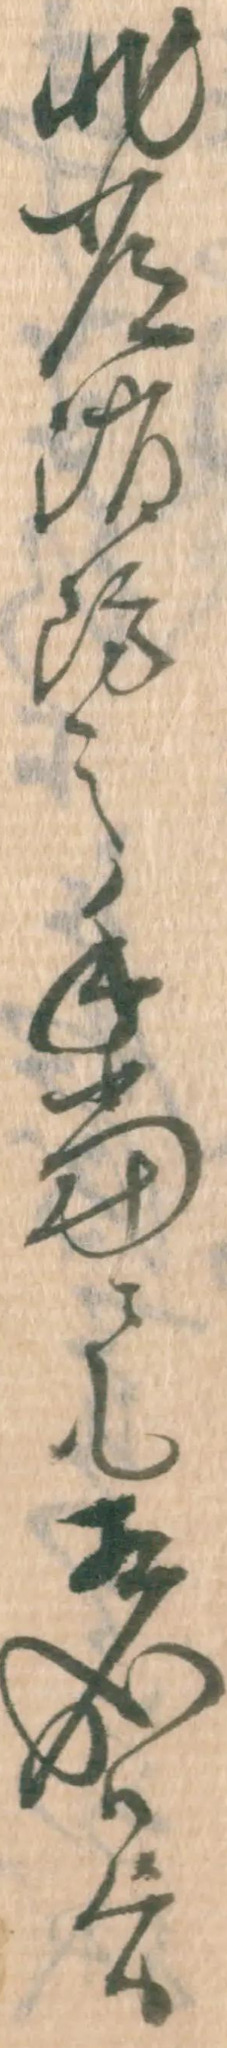非常消防之手当ニも相成候旨
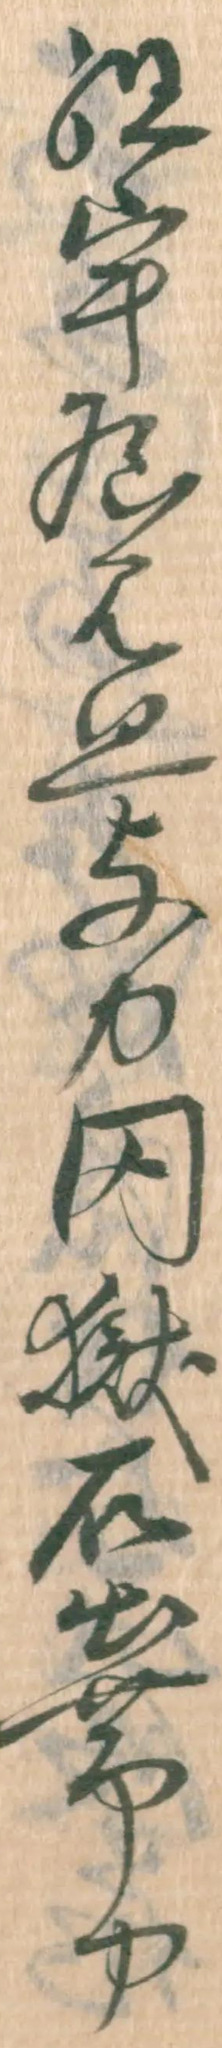組牢屋見廻与力囚獄石出帯刀
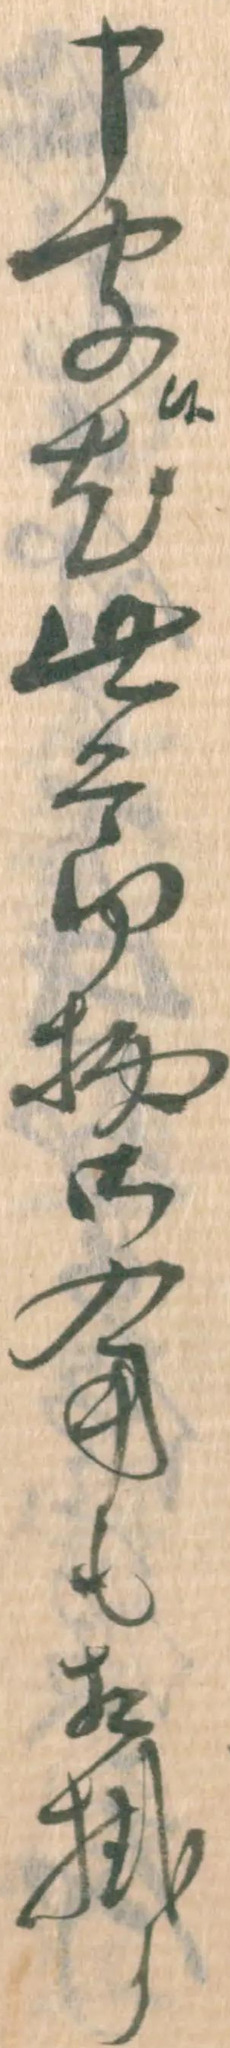申聞候尤此節柄御入用も相掛り
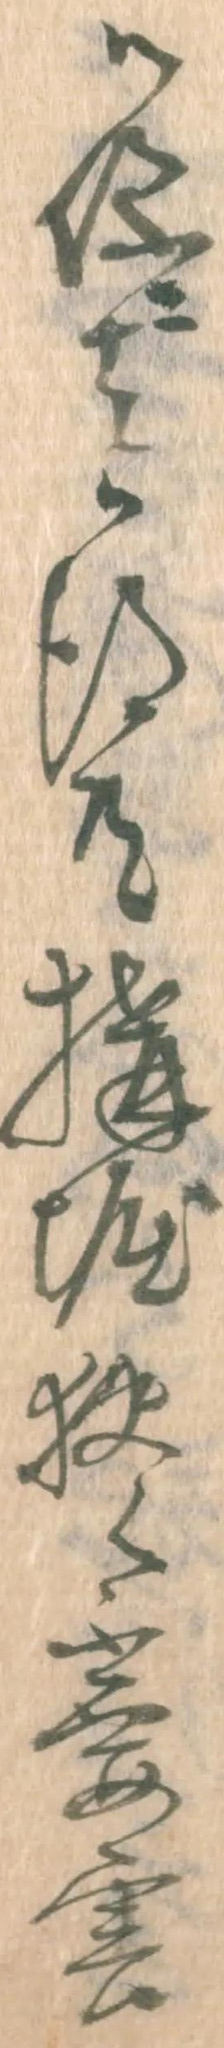候儀ニは候得共構堀狭く要害

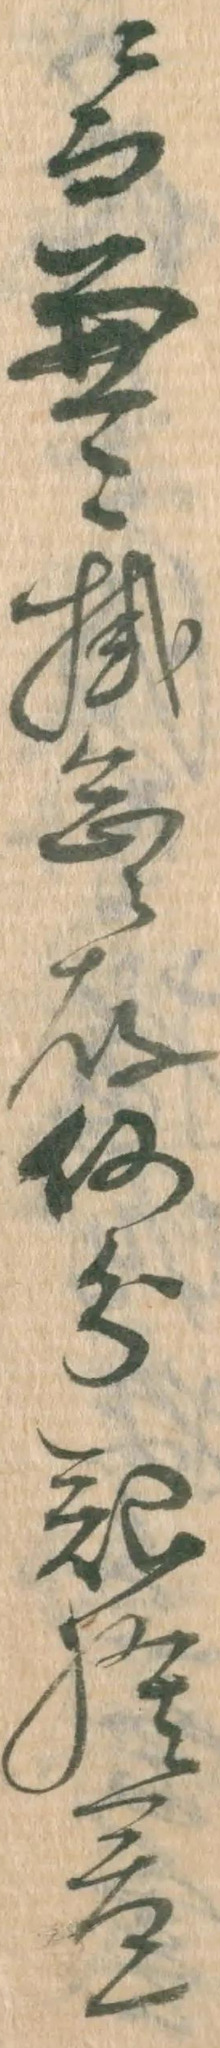ニて兼〻掛念ニ存何分難捨置
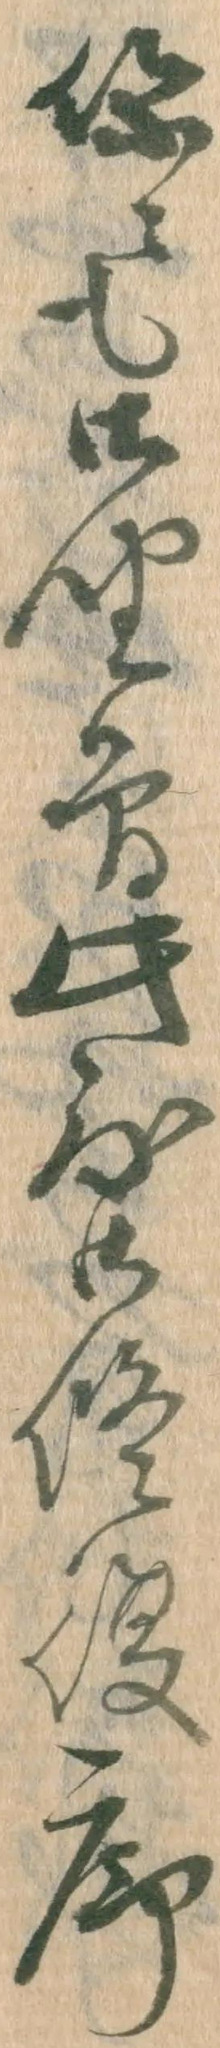儀ニも御座候間此度御修復序
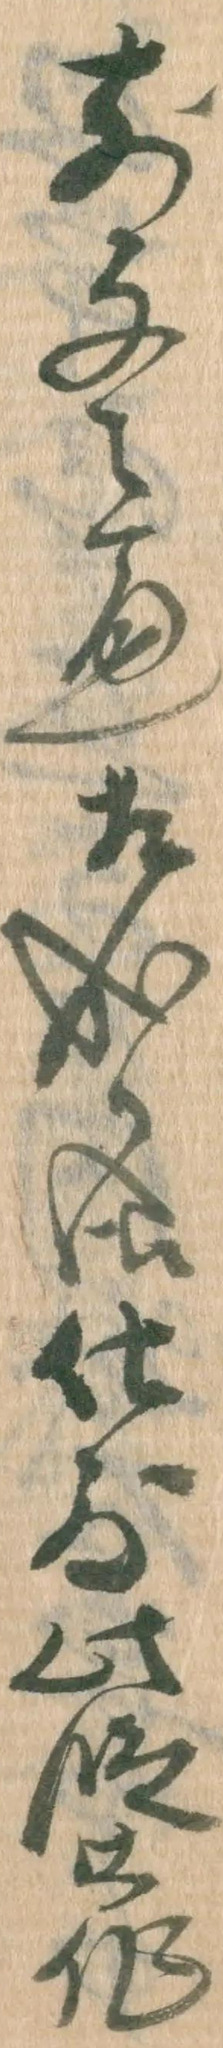前分之通相成候様仕度此段御作
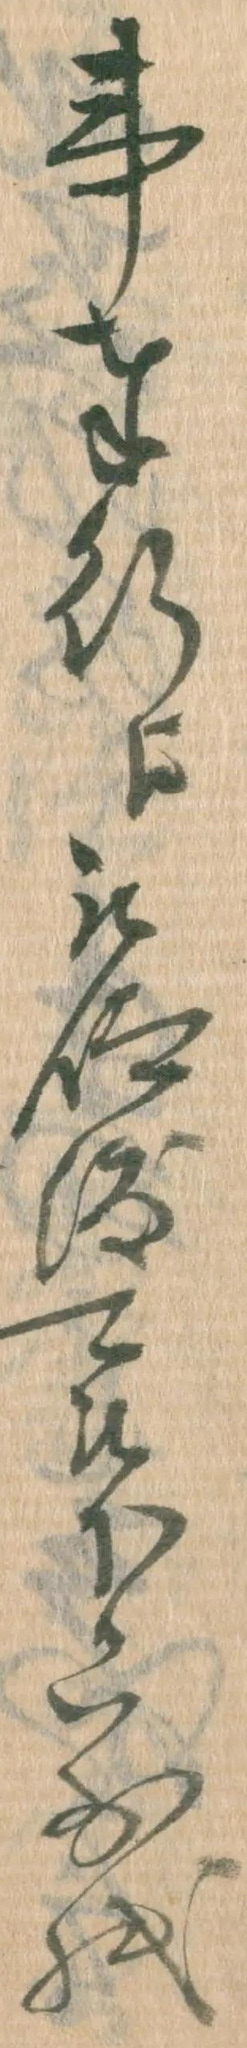事奉行え被仰渡可被下候別紙
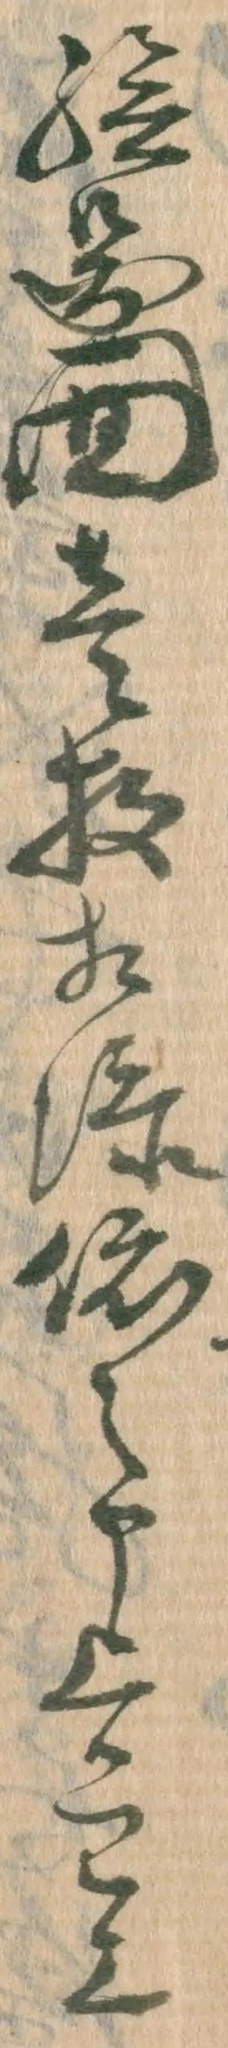絵図面壱枚相添依之申上候已上
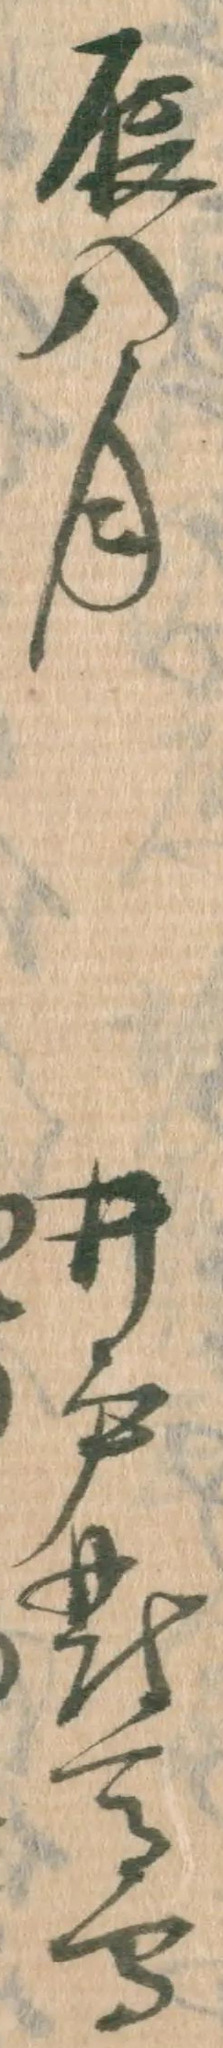辰八月井戸対馬守
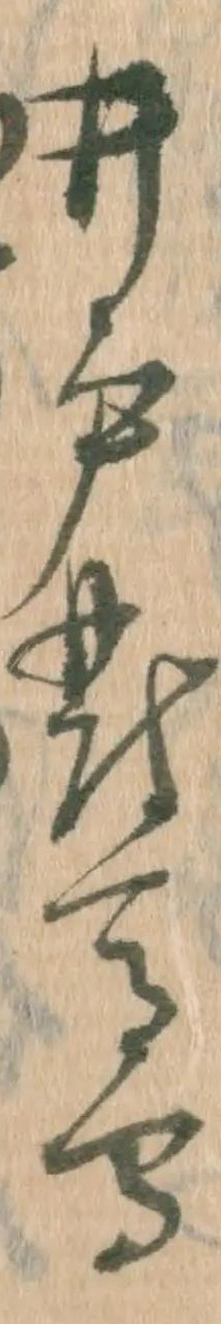辰八月井戸対馬守
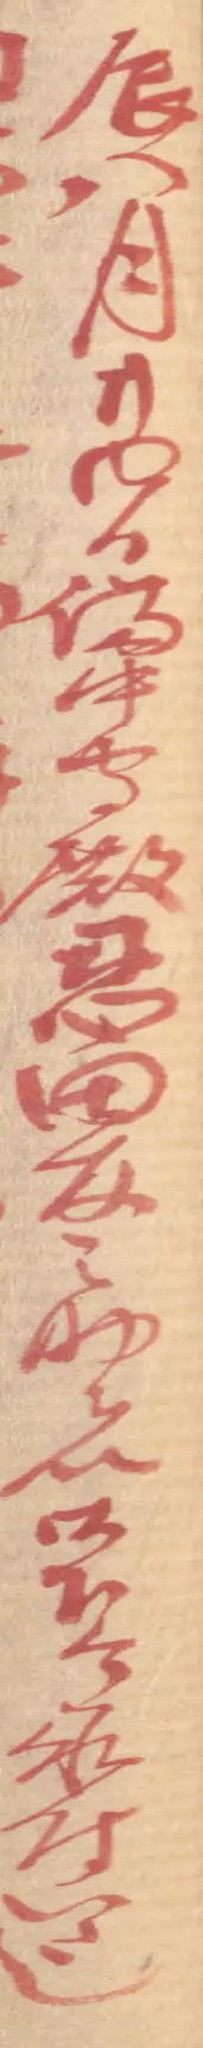「辰八月廿四日備中守殿恩田友之助ヲ以御下ケ承付いたし
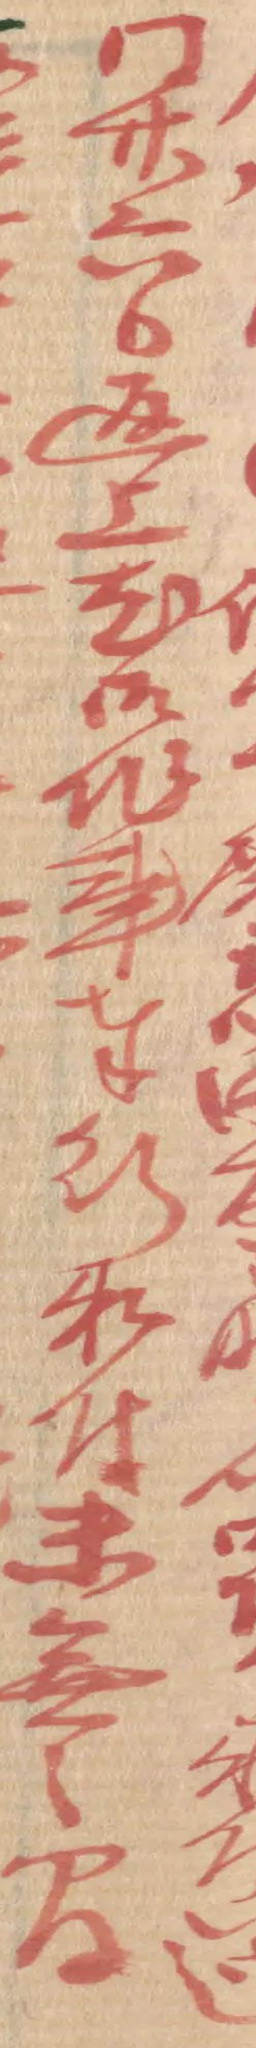同廿六日返上尤御作事奉行承付未無之間
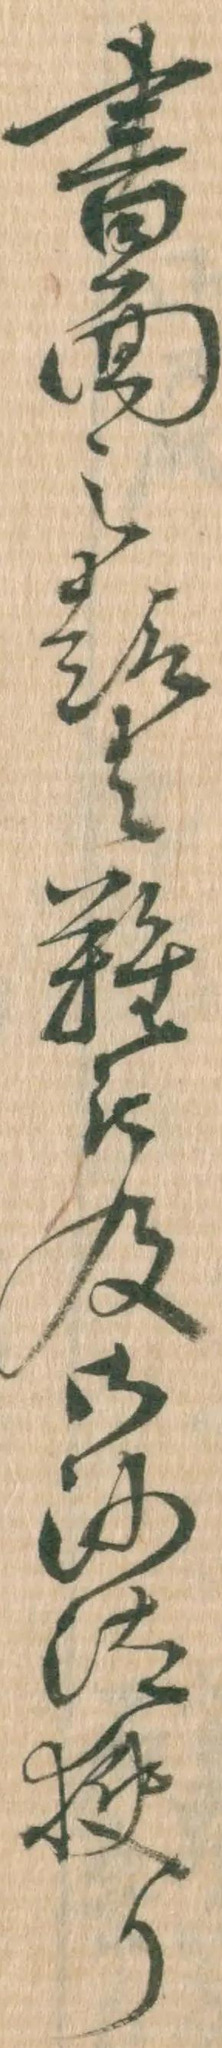書面之趣は難被及御沙汰損り
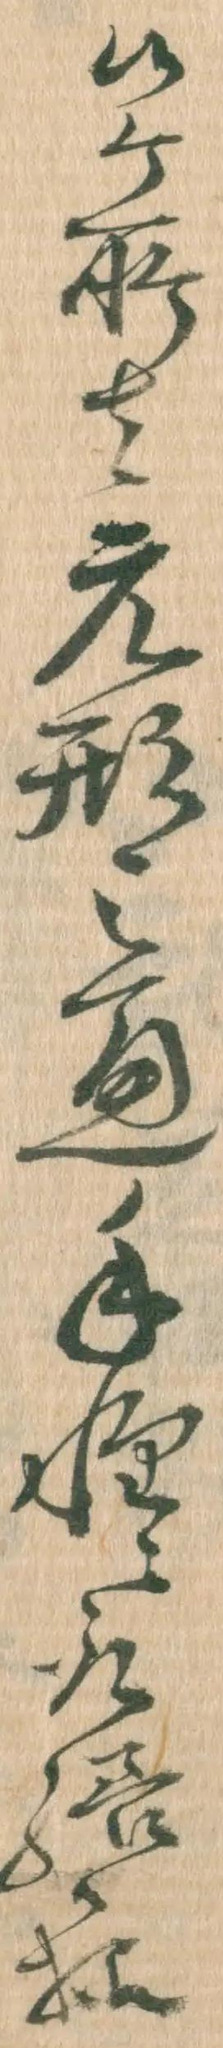候ケ所は元形之通手軽ニ取繕候様
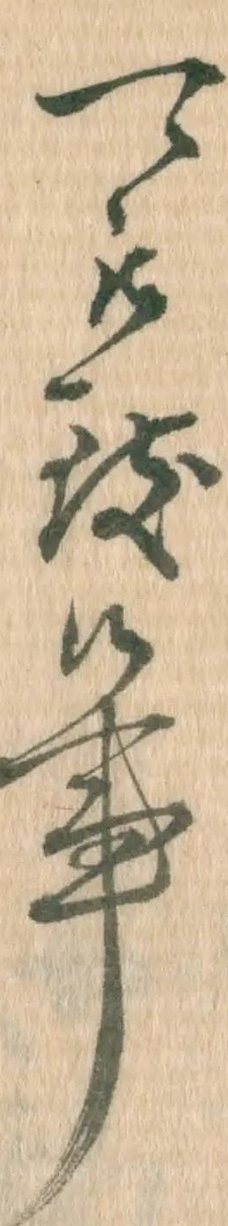可被致候事
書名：七十冊物類集 71巻. [44] 四十三 牢屋敷御普請御修覆地震ニ付骨折候牢屋掛御褒美之部
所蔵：国立国会図書館 National Diet Library, JAPAN
